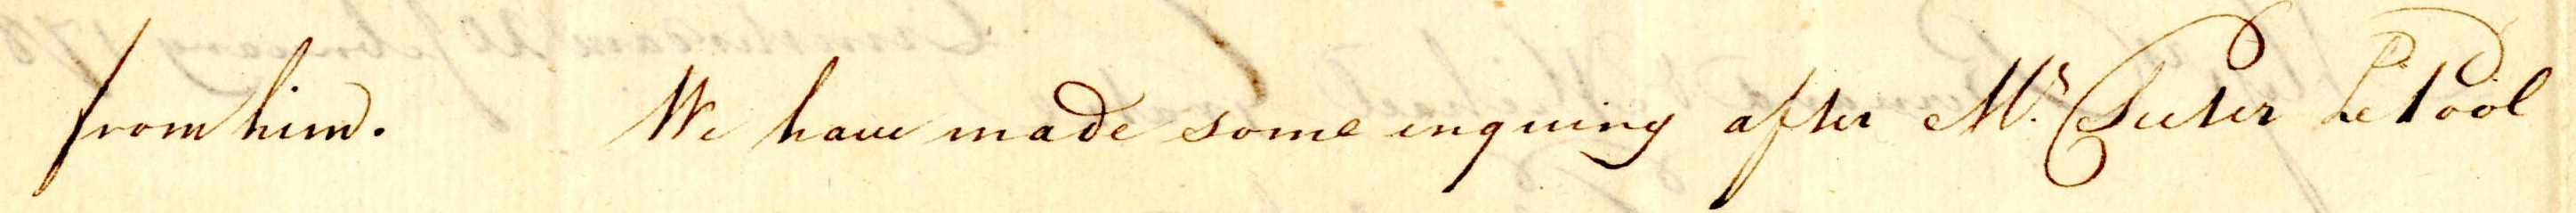from him. We have made some inquiring after M^r Peter Le Pool
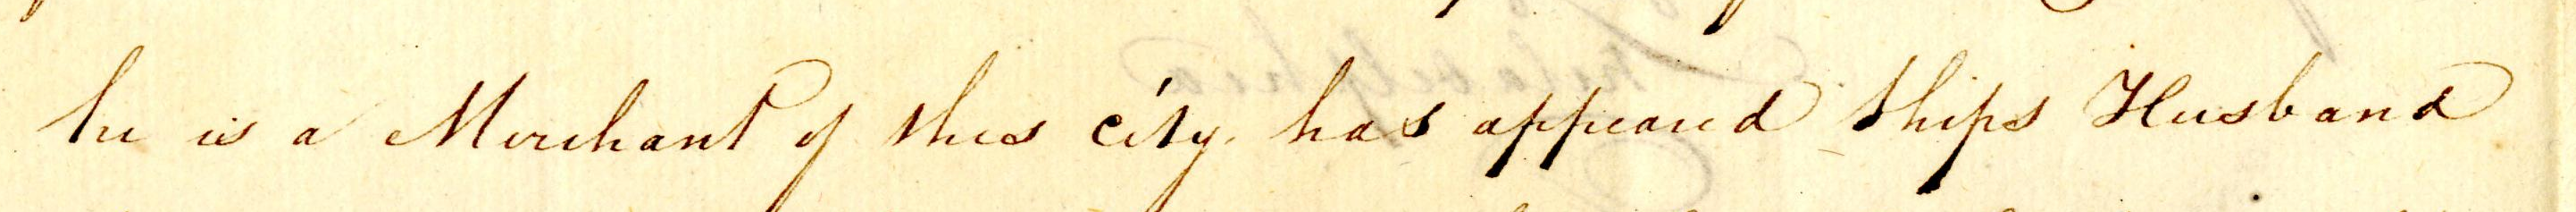he is a Merchant of this city. has appeased Ships Husband
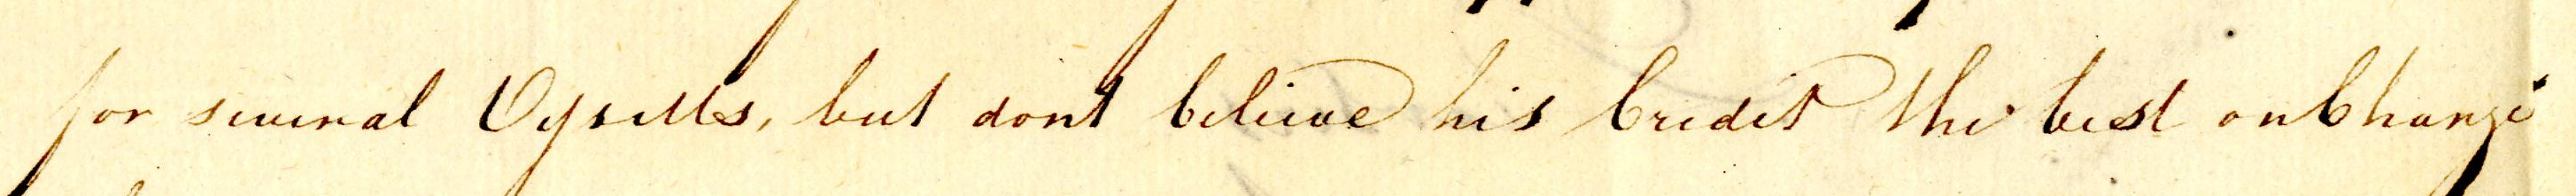for several Vesells, but dont believe his Credit the best on Change
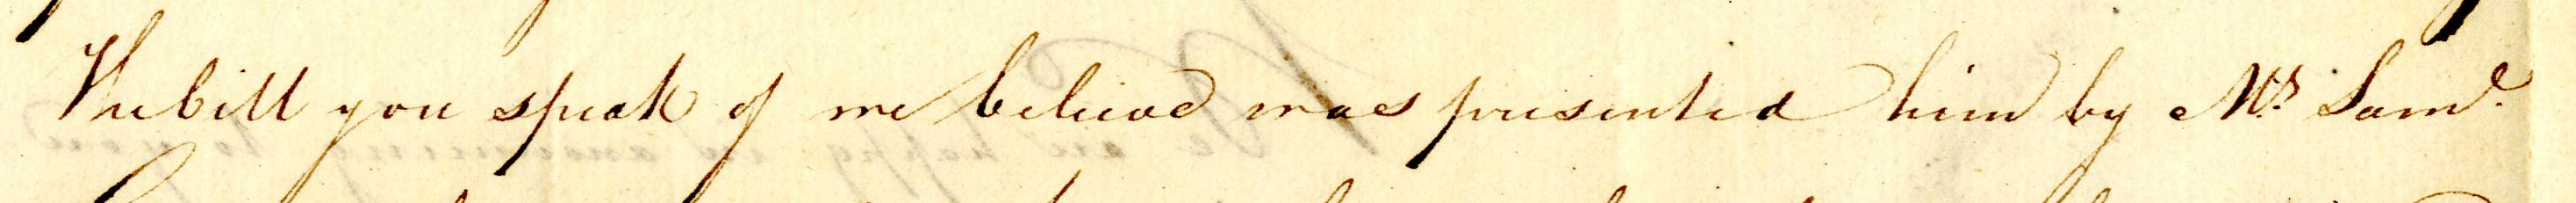the bill you speak of we belived was presented hinm by M^r Sam^l.
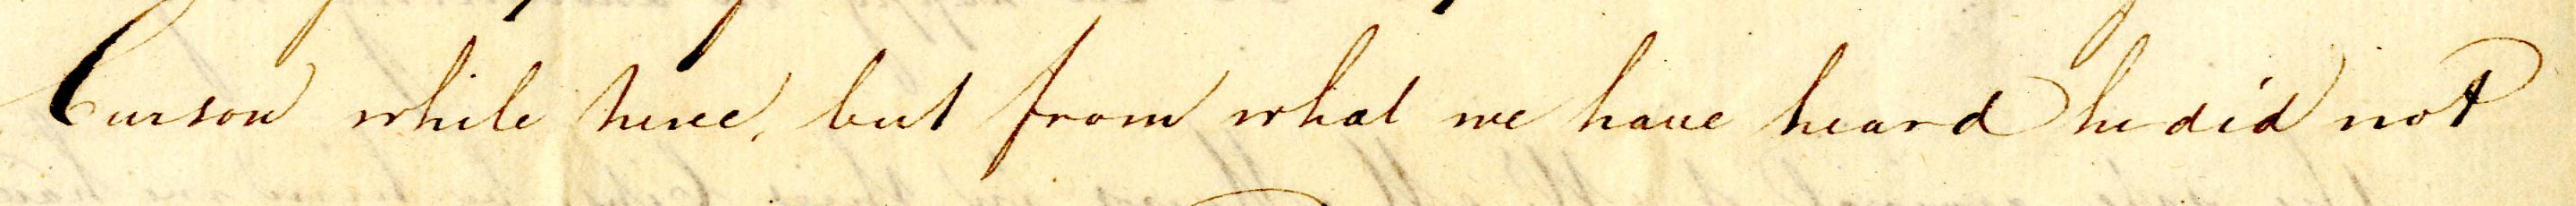Curson while here, but from what we have heard he did not
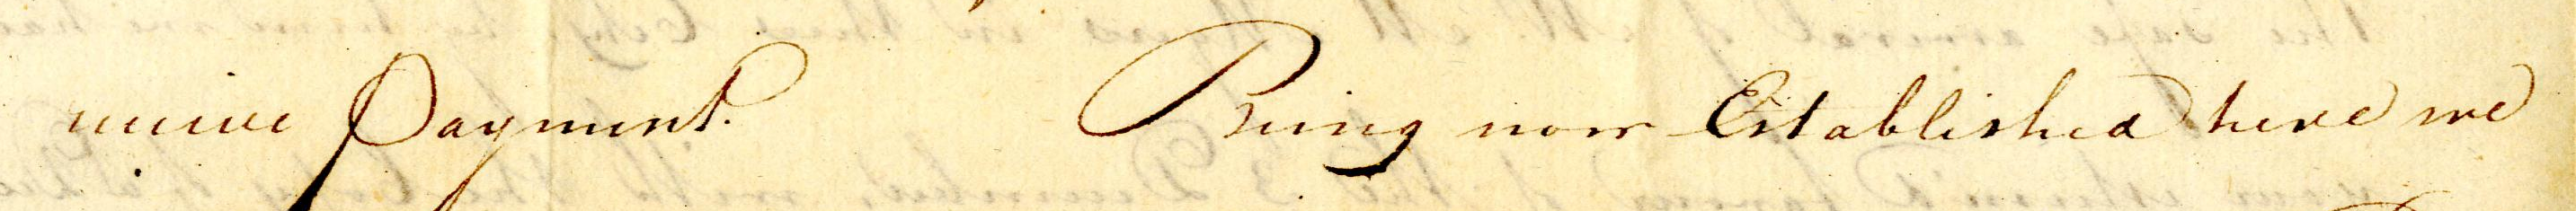recieve Payment.- Being now Established here we
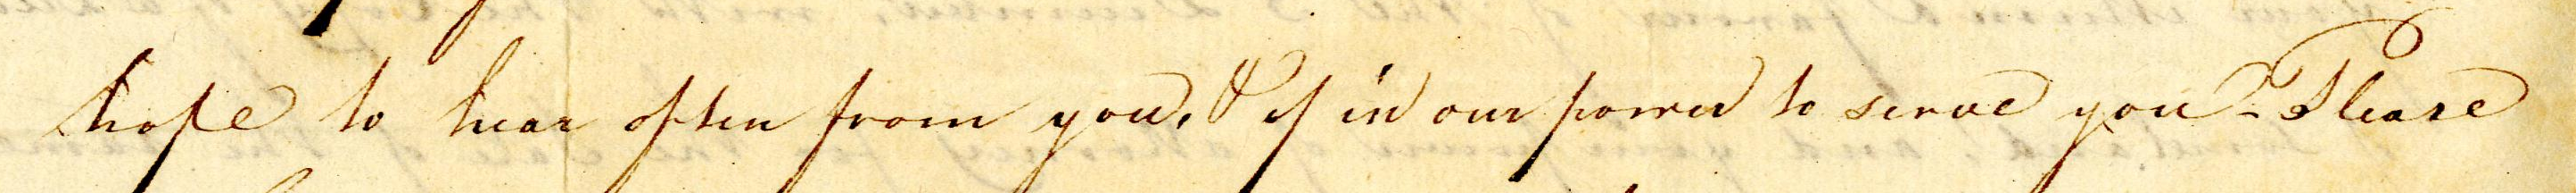hope to hear often from you, & if in our power to serve you- please
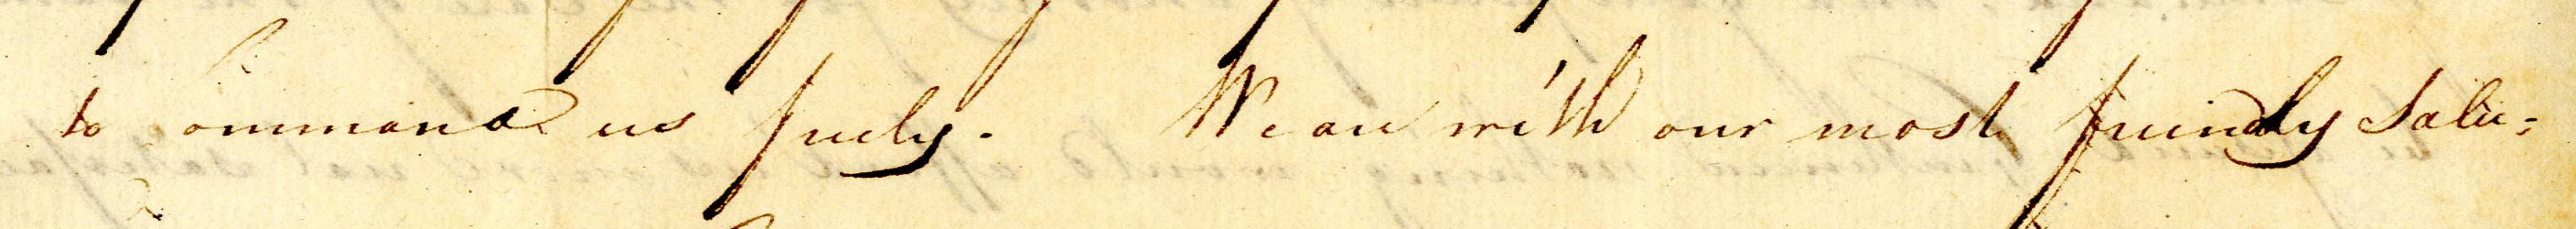to Command us freely.- we are with our most friendly Salu-
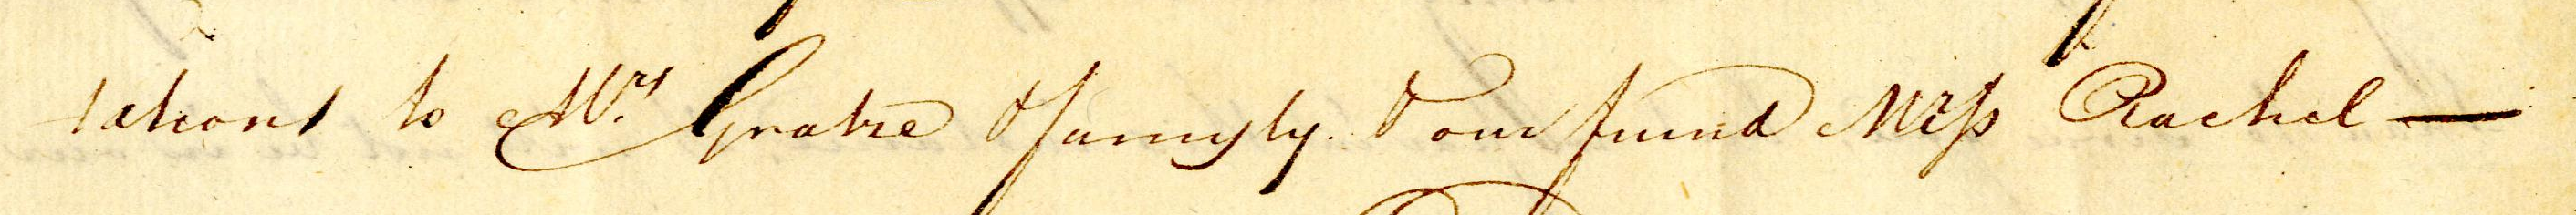-tations to M^rs Gratze & famyly. Your friend Miss Rachel-
